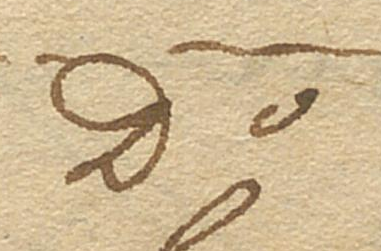D^o
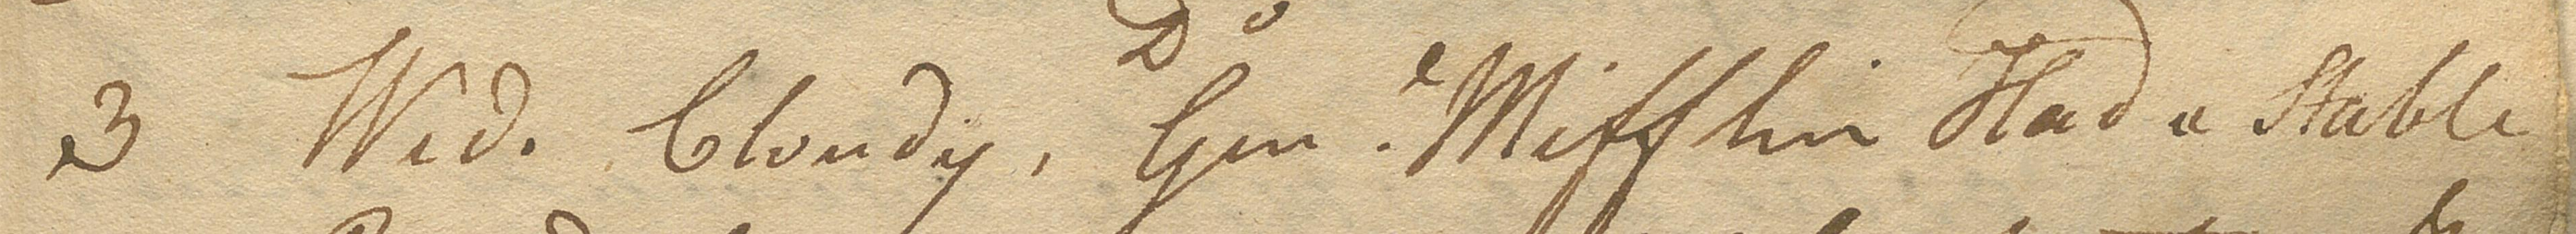3 Wed. Cloudy. Gen^l. Mifflin Had a Stable
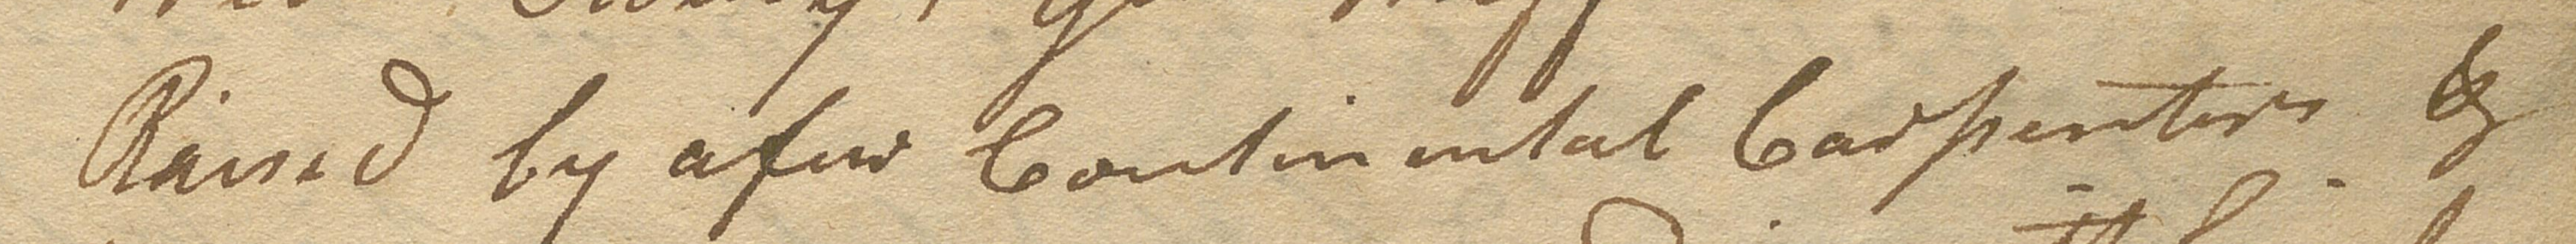Raised by a few Continental Carpenters &
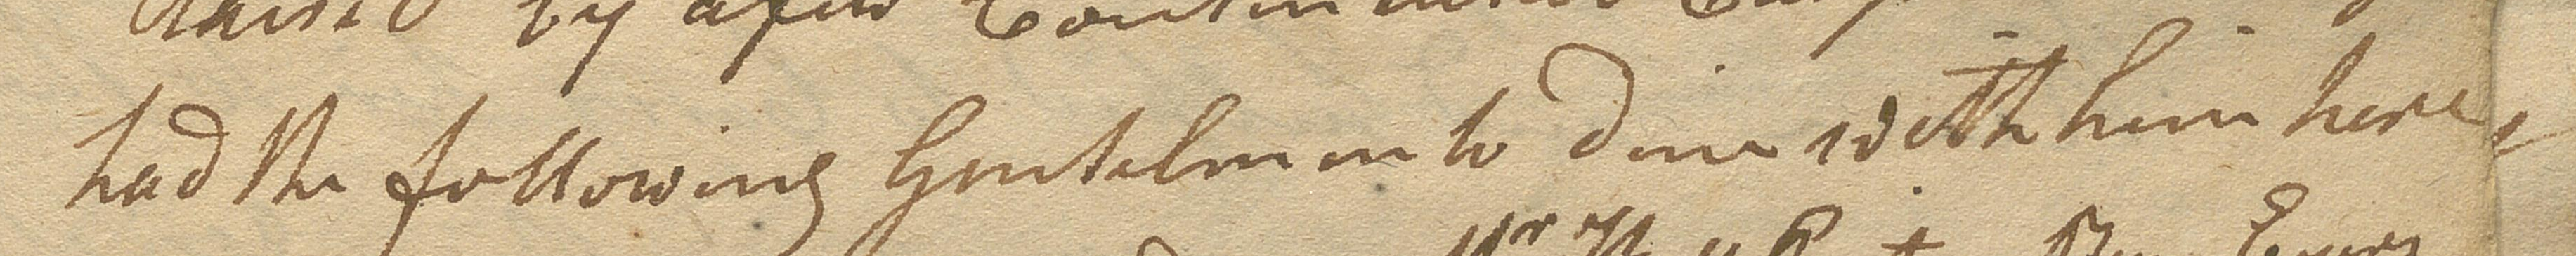had the following Gentelmen to dine with him here,
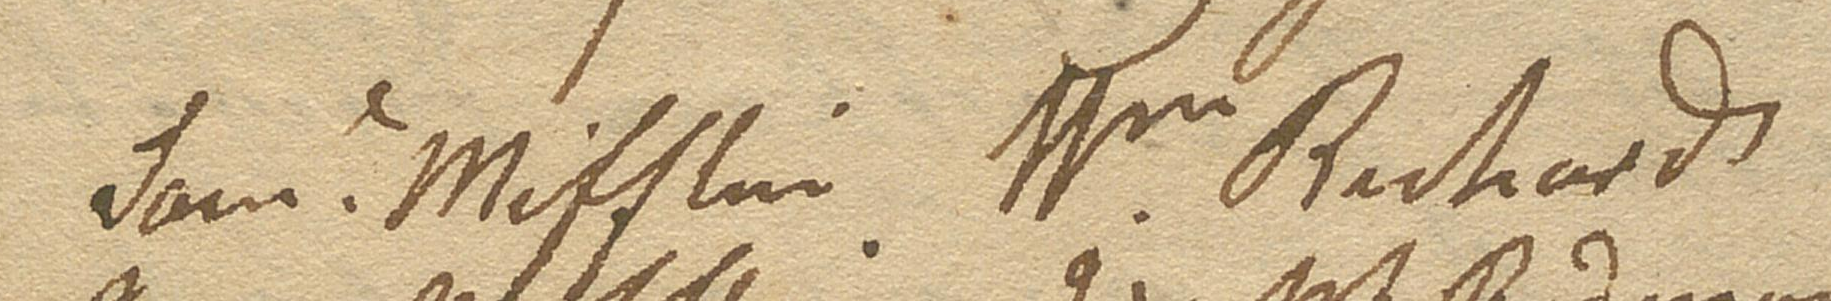Sam^l. Mifflin W^m. Richards
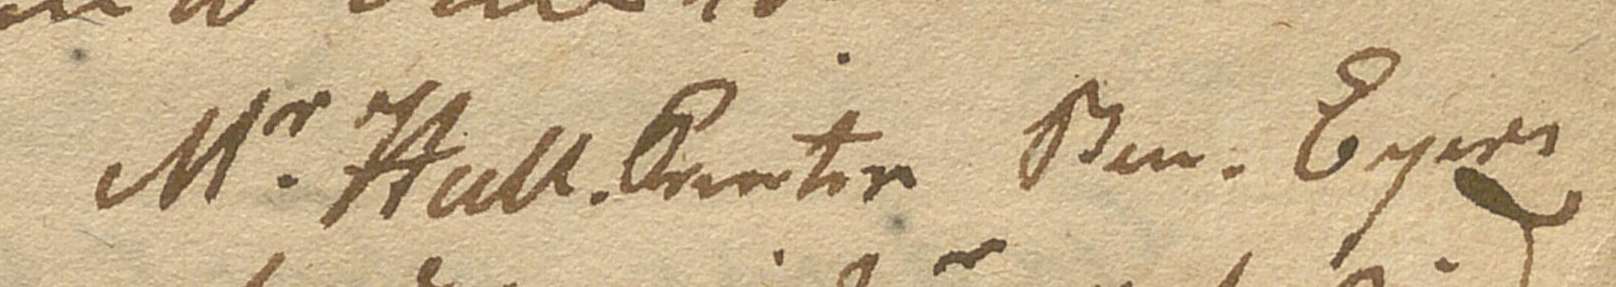M^r Hull Prentin Ben. Eyers
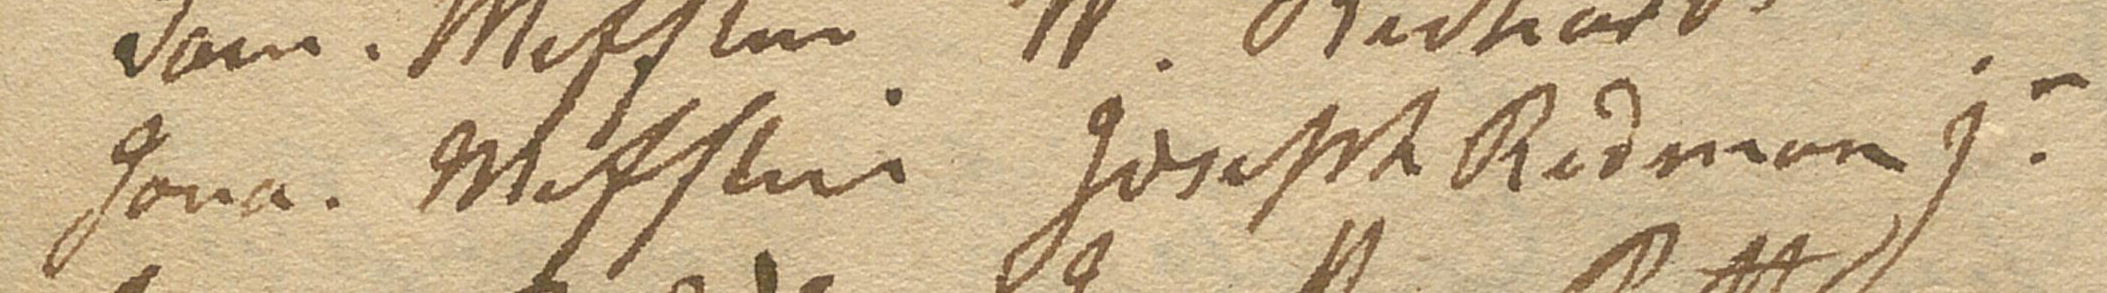Jona. Mifflin Joseph Redman j^r.
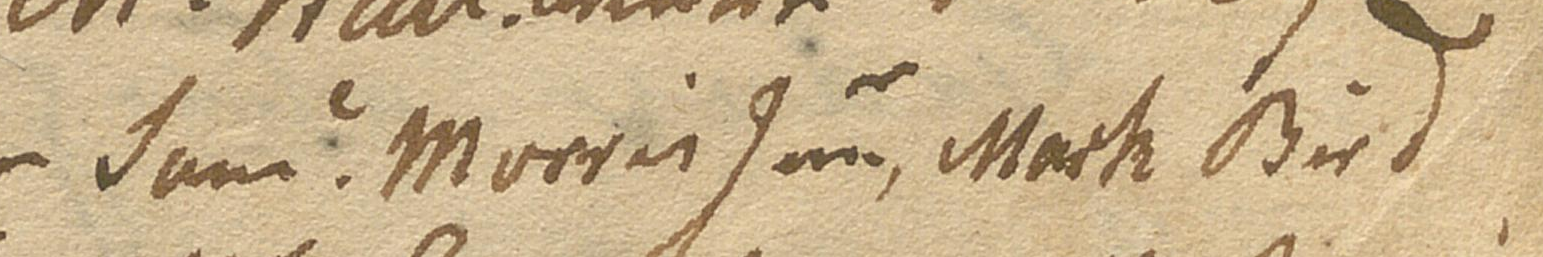Sam^l. Morris Jun^r, Mark Bird
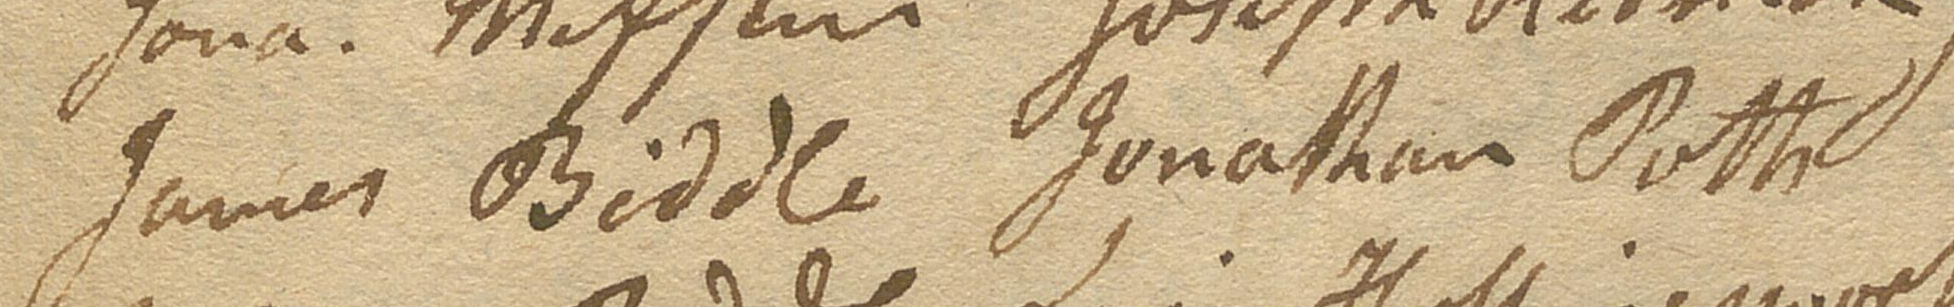James Biddle Jonathan Potts
